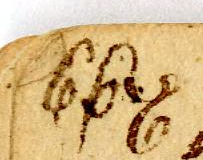66
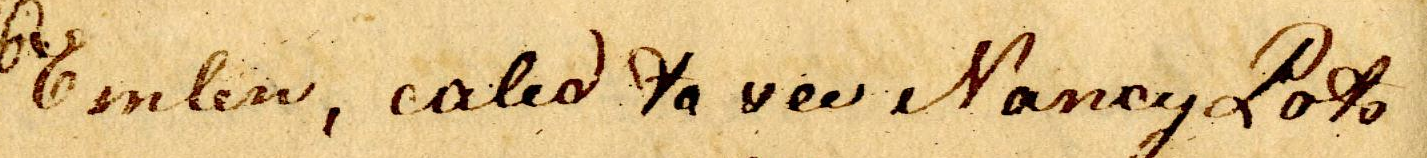Emlen, cald to see Nancy Pots
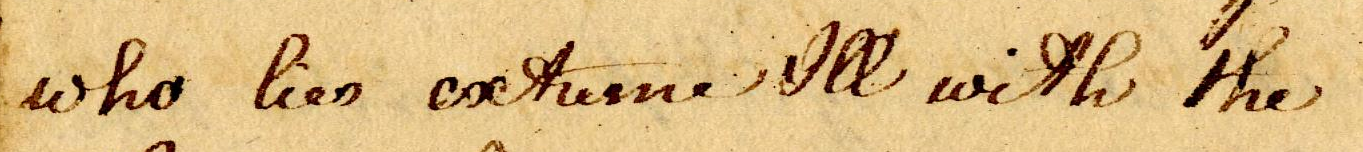who lies extreme Ill with the
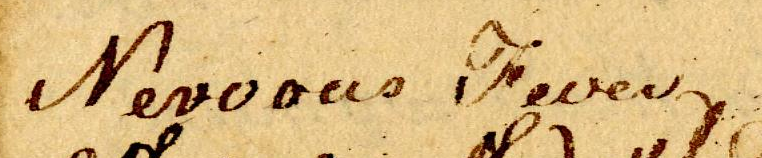Nervous Fever-
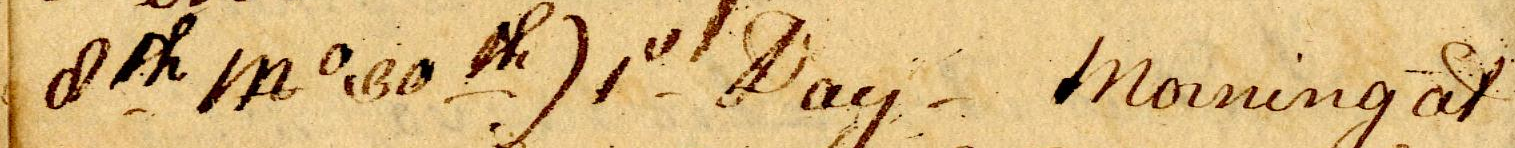8^th M^o 30^th) 1^st Day- Morning at
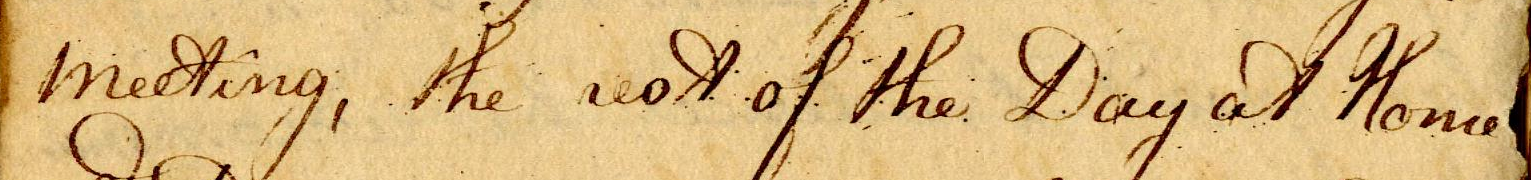Meeting, the rest of the Day at Home
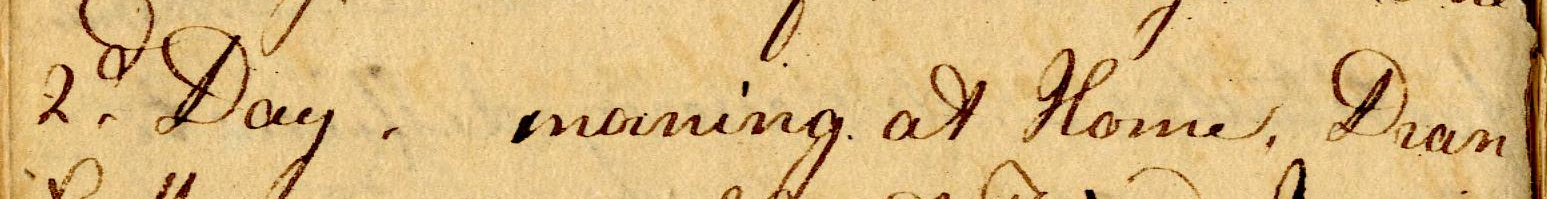2^d Day. morning at Home, Dran
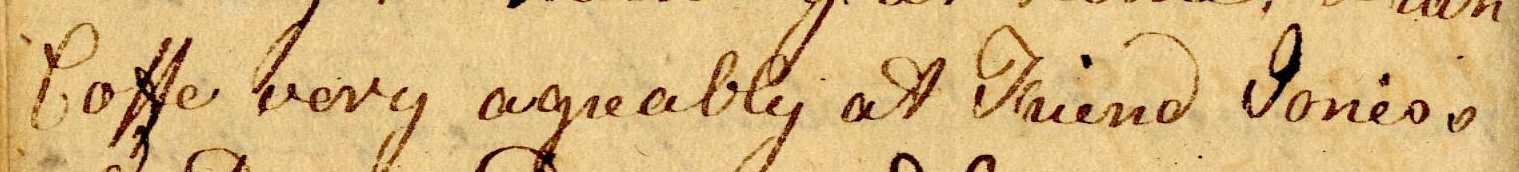Coffe very agreably at Friend Jones s
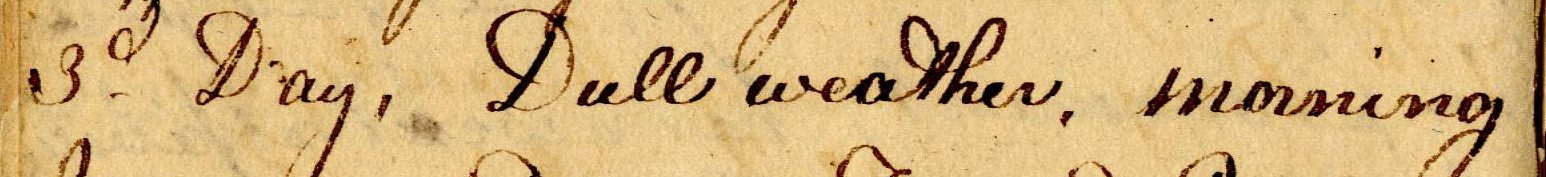3^d Day, Dull weather, morning
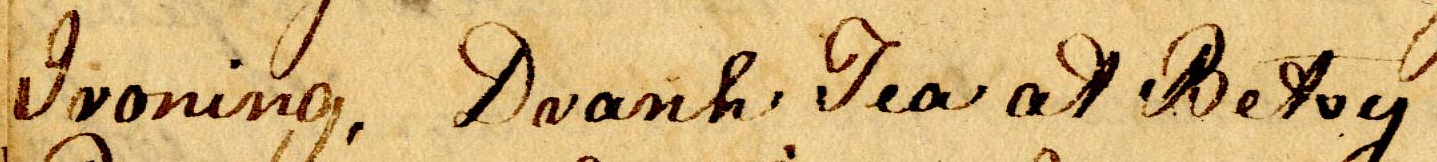Ironing, Drank Tea at Betsy
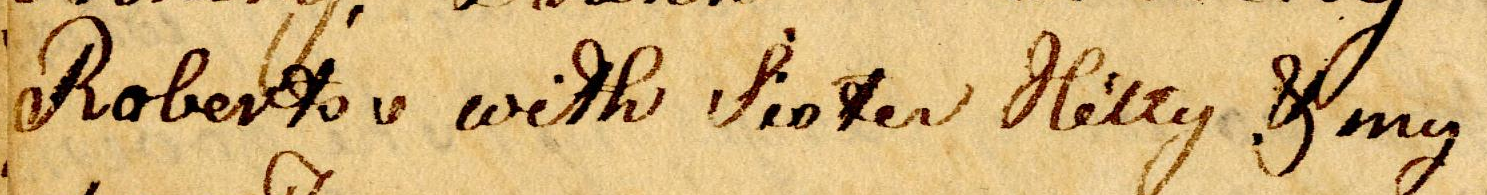Roberts s with Sister Hetty & my
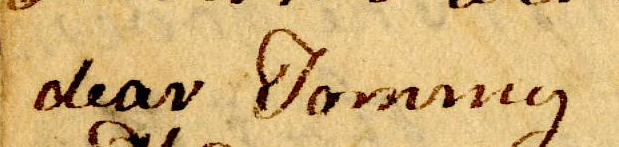dear Tommy
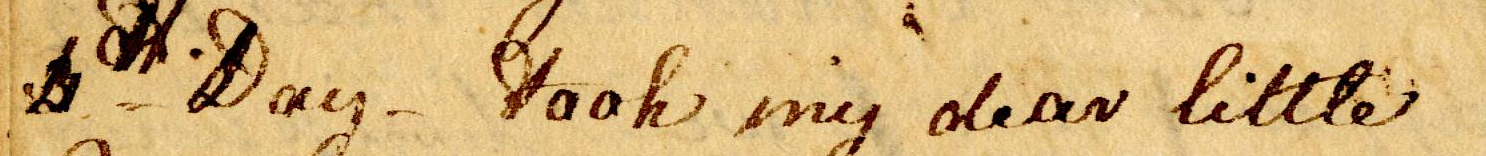4^th Day- took my dear little
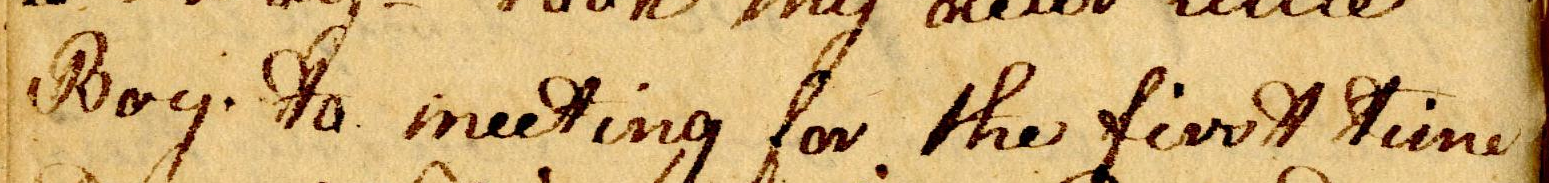Boy. to meeting for the first time
